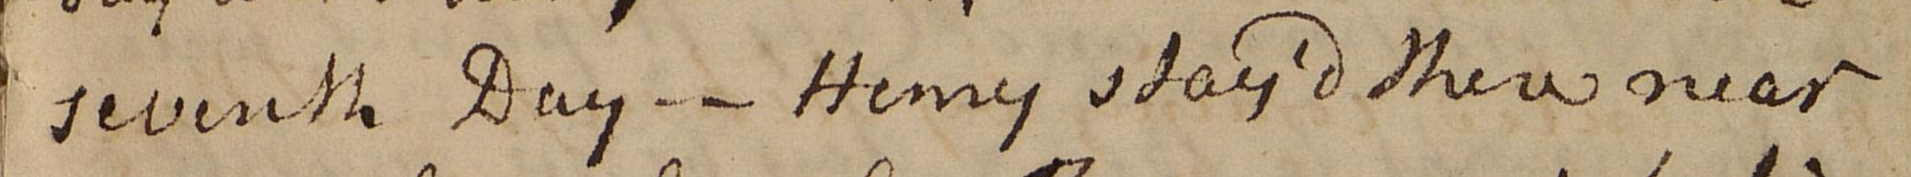seventh Day-- Henry stay'd then near
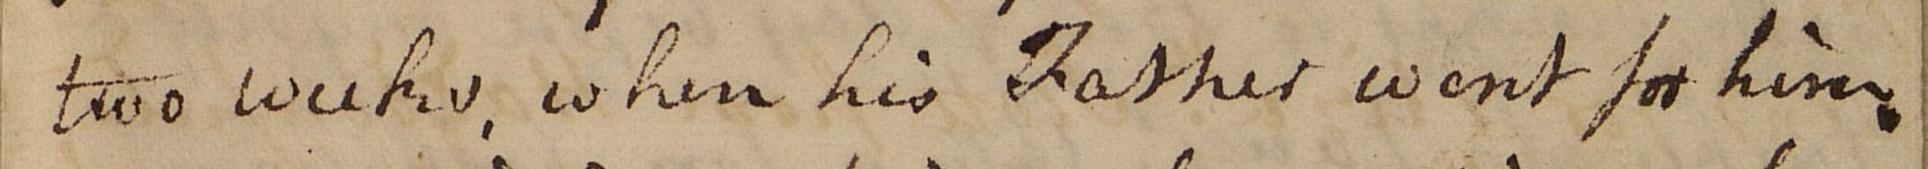two weeks, when his Father went for him.
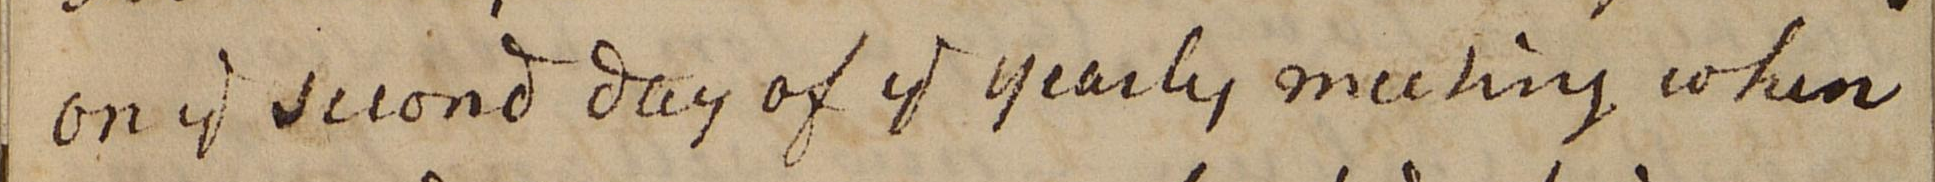on y^e second day of y^e yearly meeting when
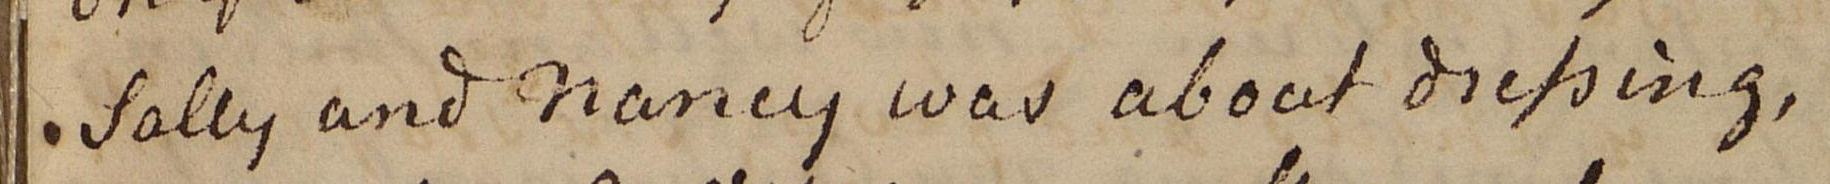.Sally and Nancy was about dressing,
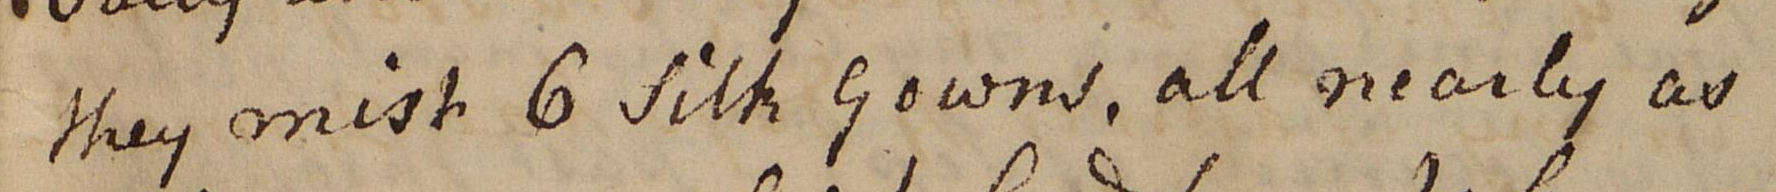they mist 6 Silk Gowns, all nearly as
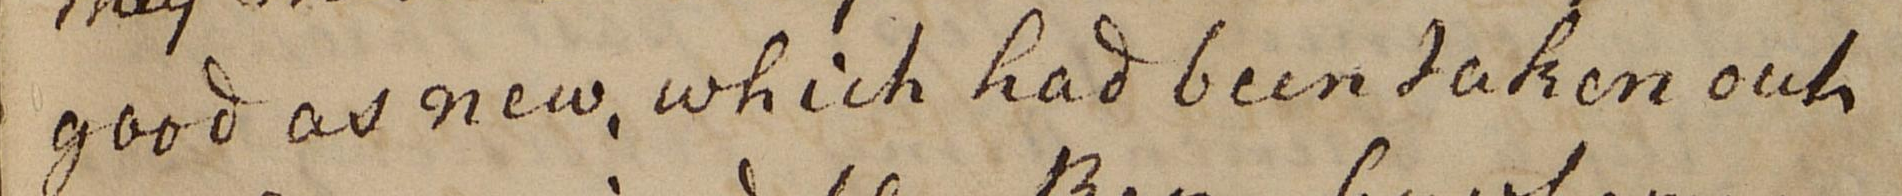good as new, which had been taken out
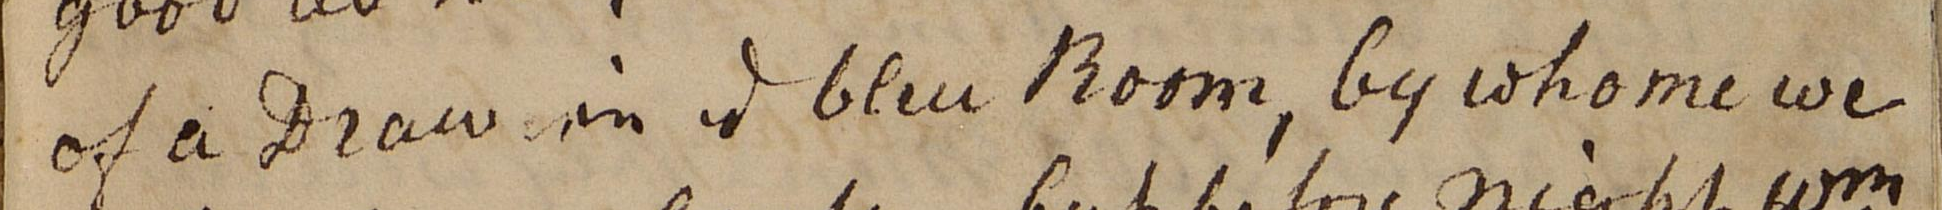af a Draw in y^e bleu Room, by whome we
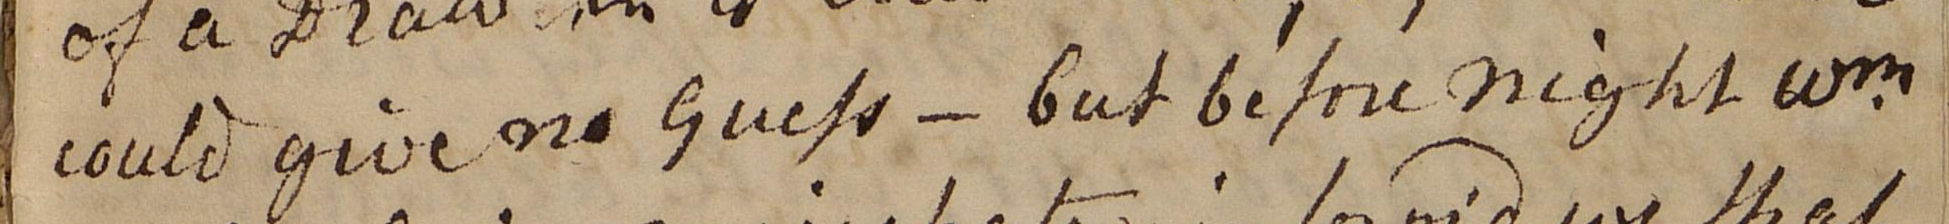could give no Guess- but before night W^m.
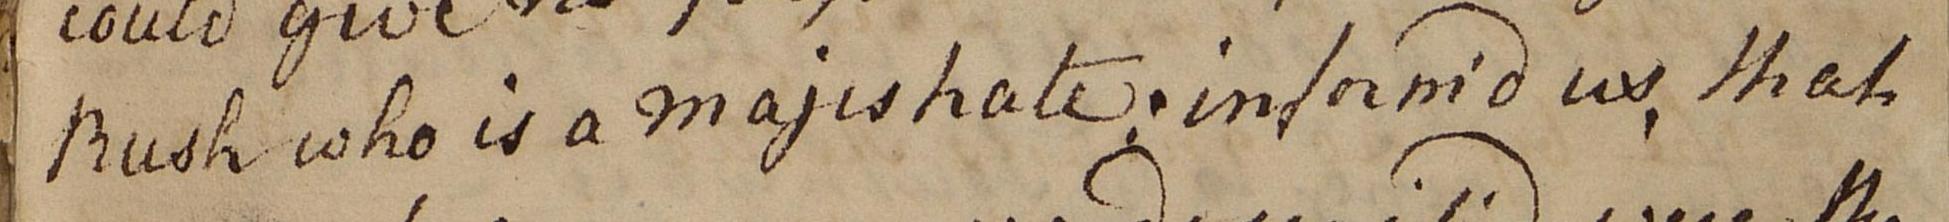Rush who is a majistrate. inform'd us, that
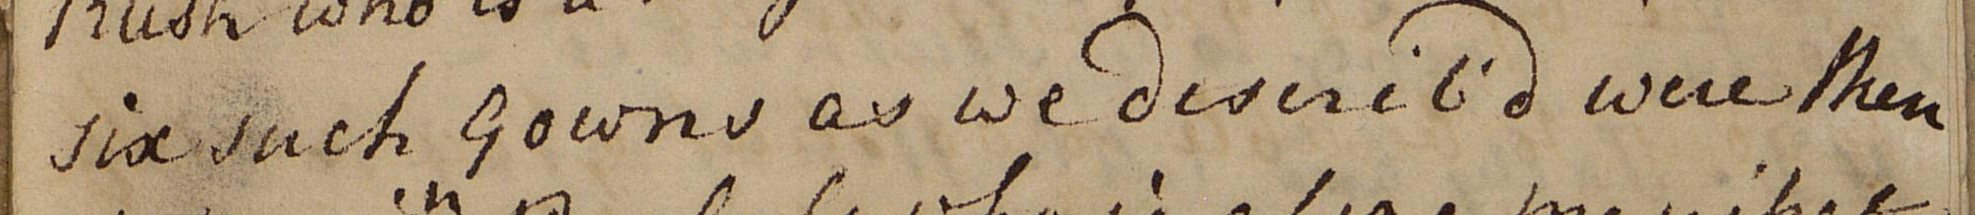six such Gowns as we discrib'd were then
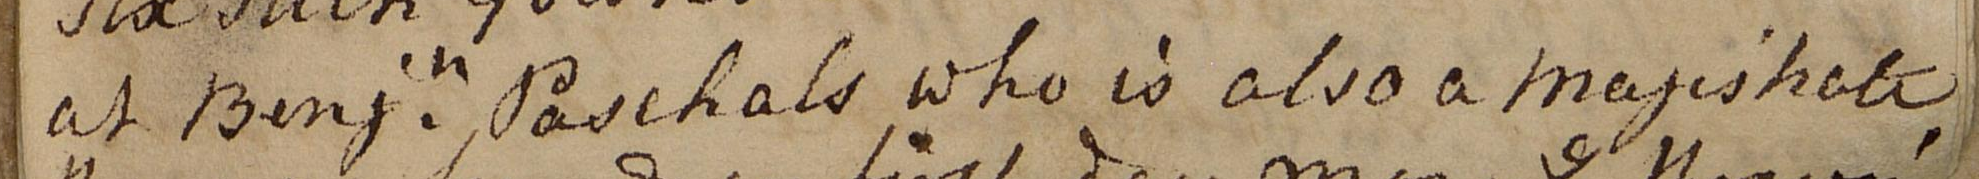at Benj^n Paschals who is also a majistrate
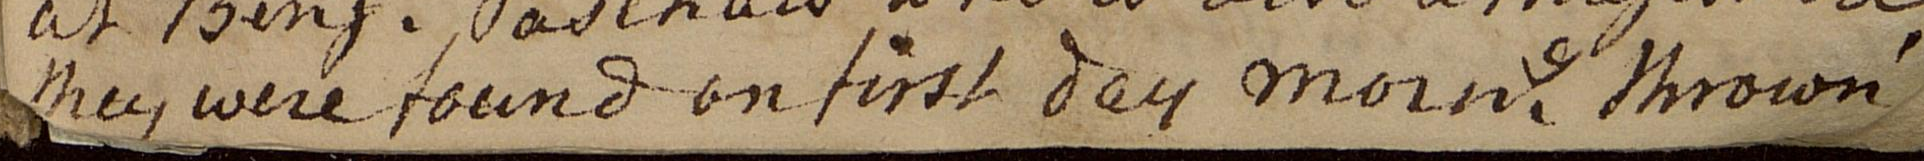thee were found on first day morn^g. thrown
